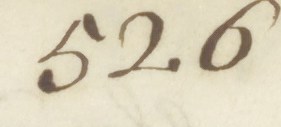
526
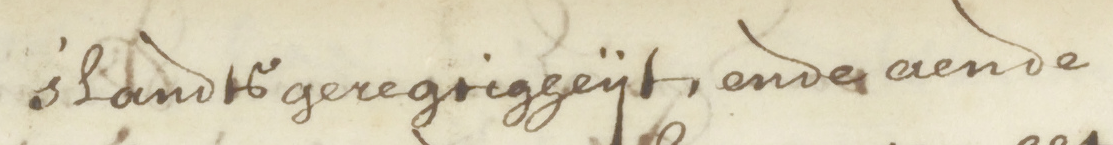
s'landts geregtigheijt, ende aende
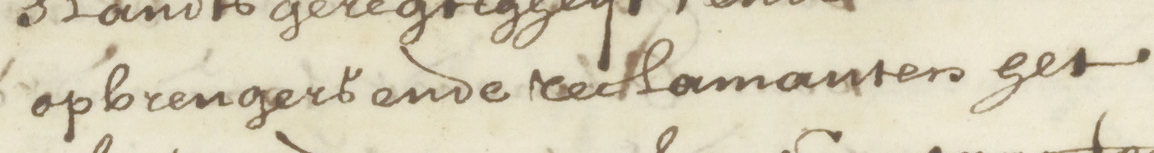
opbrengers ende reclamanten het
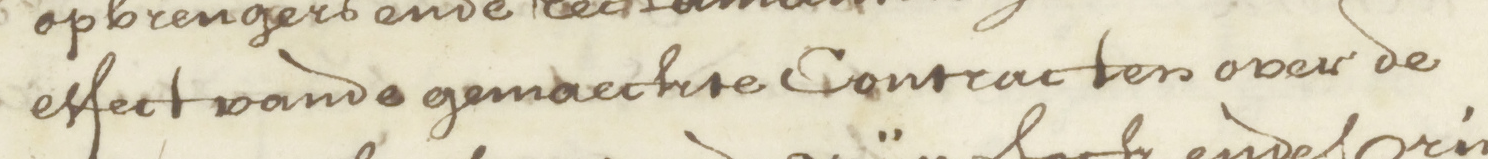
effect vande gemaeckte Contracten over de
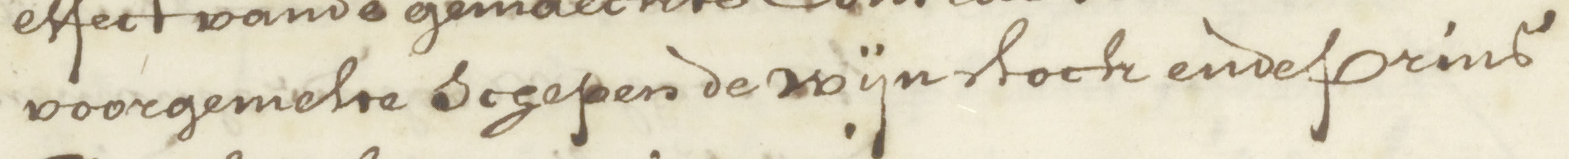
voorgemelte schepen de wijnstock ende Prins
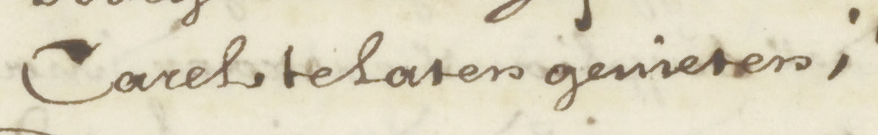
Carel te laten genieten;
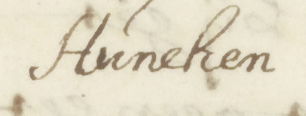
Huneken
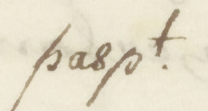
paspt.
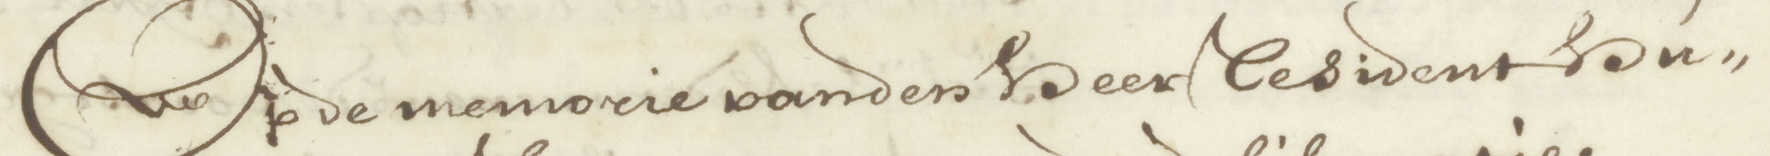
Opde memorie vanden Heer resident Hu„
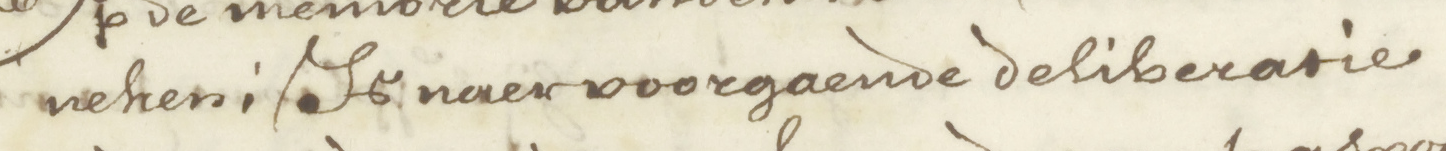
neken: Is naer voorgaende deliberatie
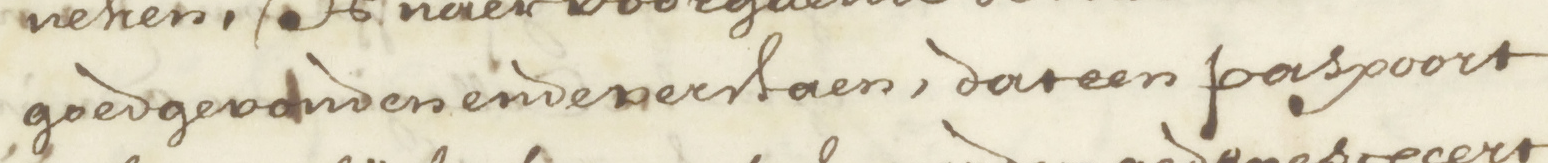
goedgevanden ende verstaen, dat een paspoort
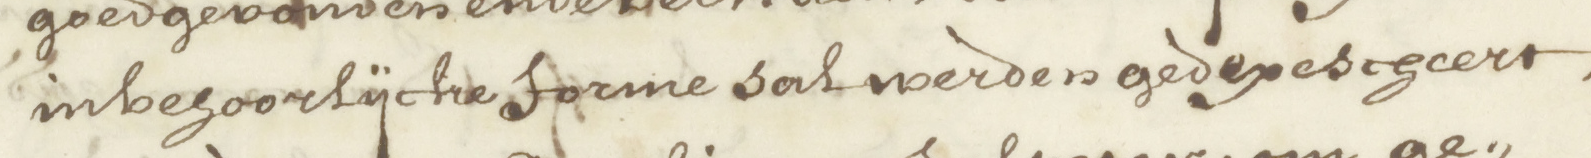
in behoorlijcke forme sal werden gedepescheert
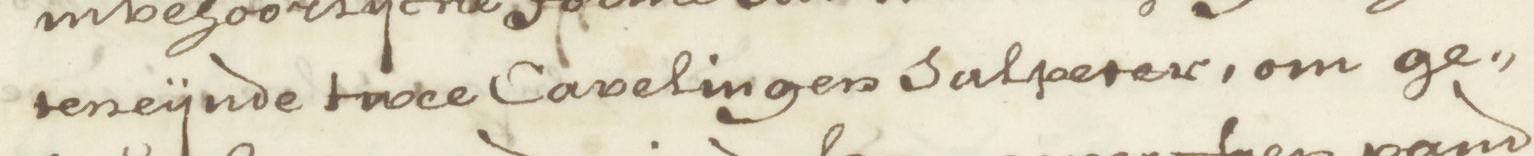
teneijnde twee Cavelingen Salpeter, om ge„
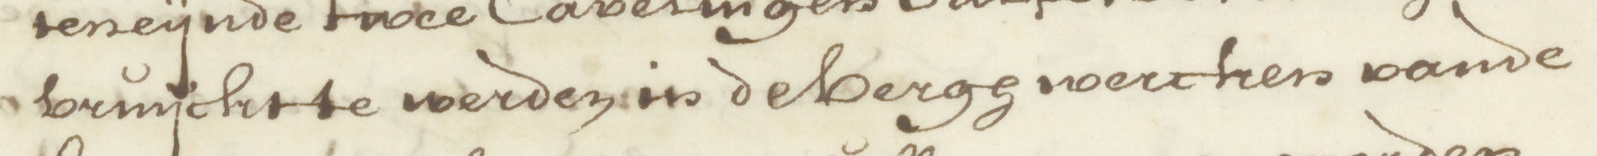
bruijckt te werden in de bergh wercken vande
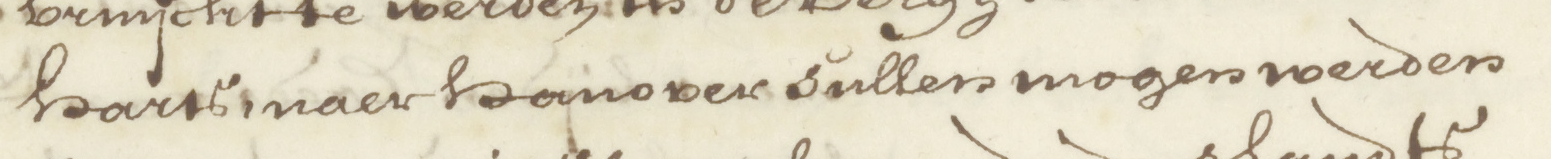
harts naer Hanover sullen mogen werden
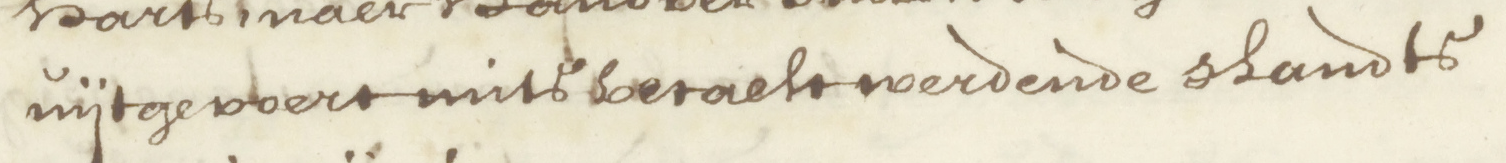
uijtgevoert mits betaelt werdende slandts
